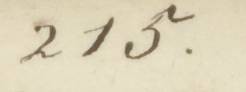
215
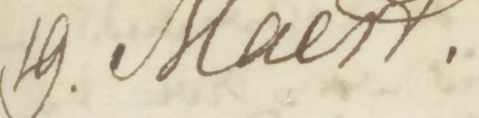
19 Maert.
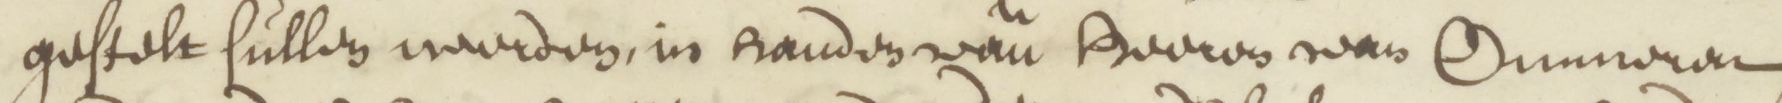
gestelt sullen worden in handen van Heeren van Ommeren,
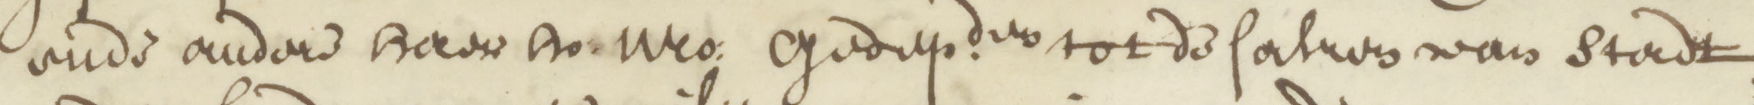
ende andere haer Ho:Mo: Gedep.den tot de saken van Stadt
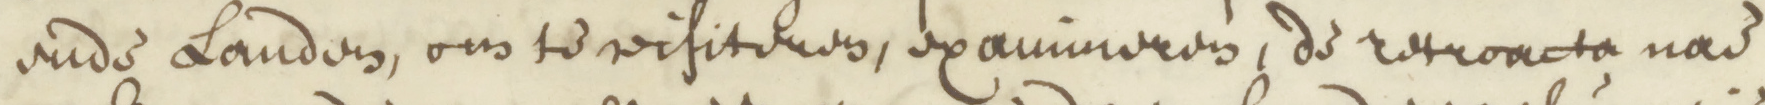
ende Landen, om te visiteren, examineren, de retroacta nae
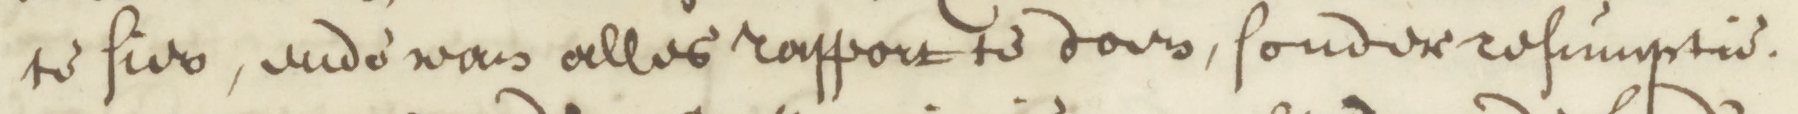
te sien, ende van alles rapport te doen, sonder resumptie.
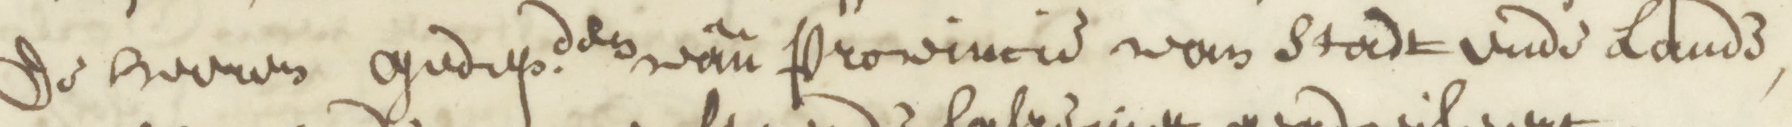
De heeren Gedep.den van Provincie van Stadt ende Lande
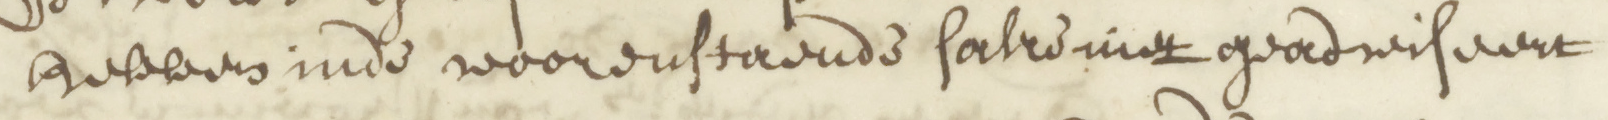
hebben in de voorenstaende sake niet geadviseert.
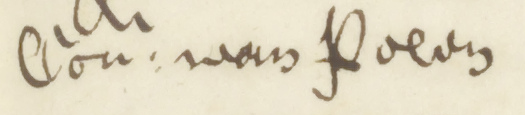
Con. van Polen
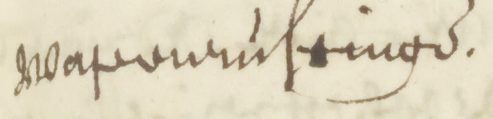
wapenrustinge
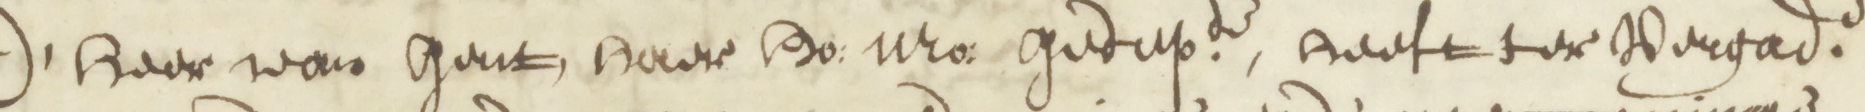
D' heer van Gent haer Ho:Mo: gedepde, heeft ter vergad.e
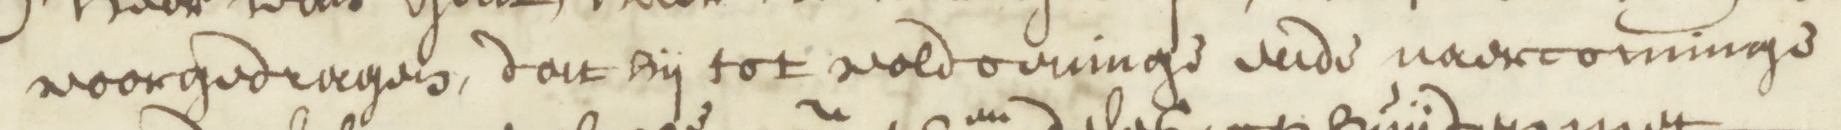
voorgedragen dat hij tot voldoeninge ende naecominge
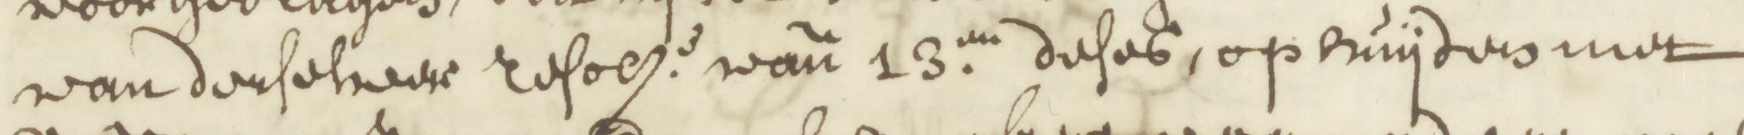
van derselver resol.e van 13en deses, op huijden met
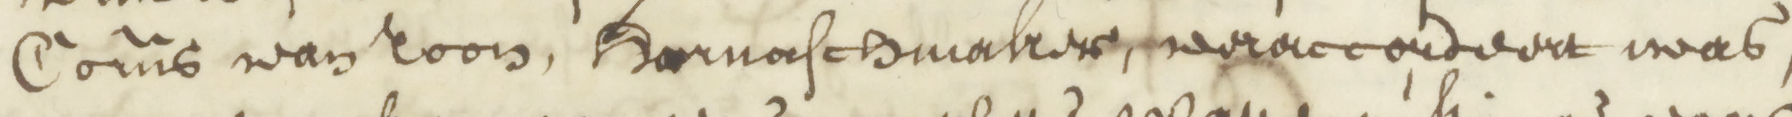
Corns van roon, Harnaschmaker, veraccordeert was,
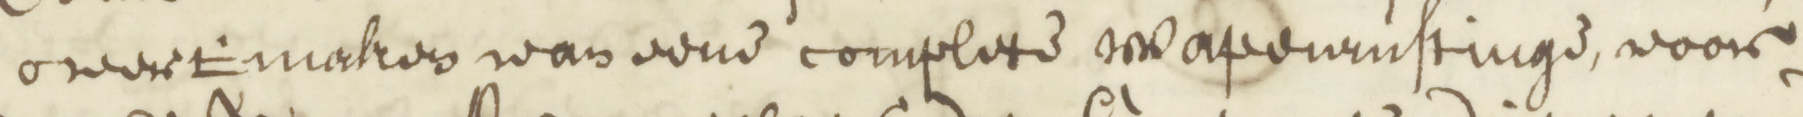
over t' maken van eene complete Wapenrustinge voor
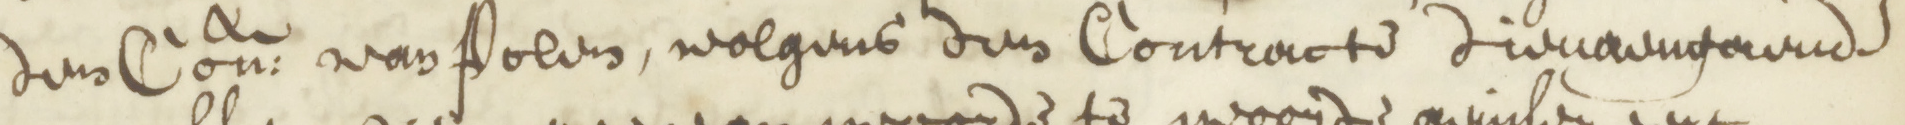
den Con. van Polen, volgens den Contracte dienaengaende
